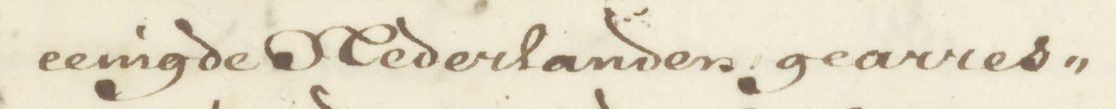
eenigde Nederlanden gearres„
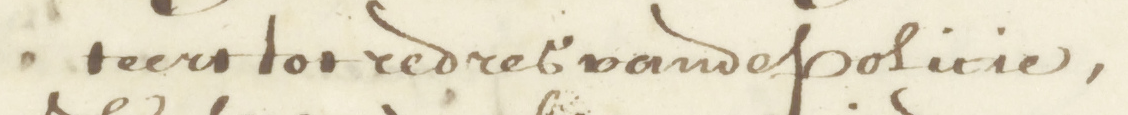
teert tot redres vande Policie,
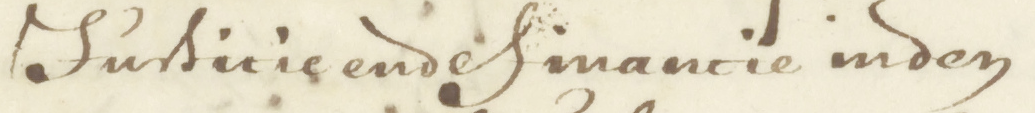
Justicie ende Financie inden
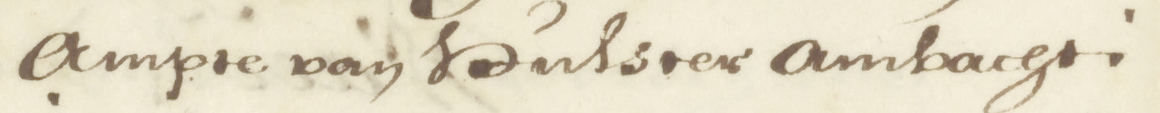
Ampte van Hulser Ambacht.
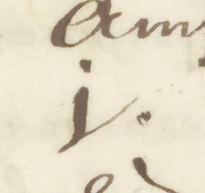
1.
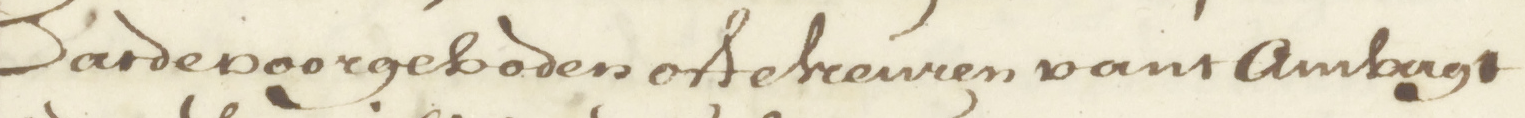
Dat de voorgeboden offe keuren van‛t Ambagt
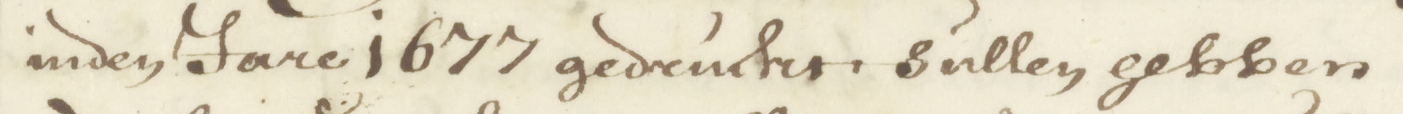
inden Jare 1677 gedruckt, sullen hebben
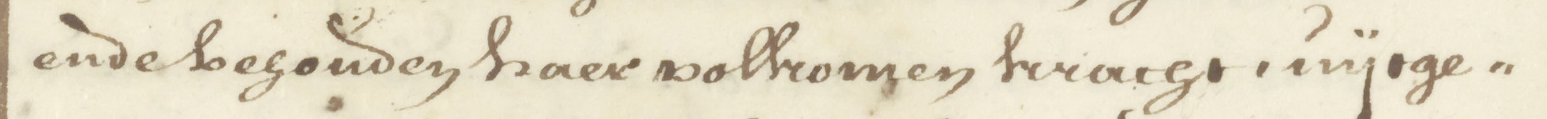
ende behouden haer volkomen kracht uijtge„
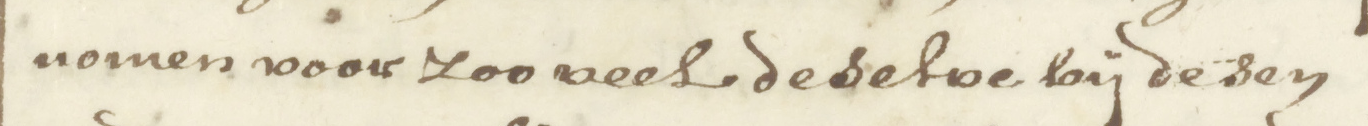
nomen voor zoo veel deselve bij desen
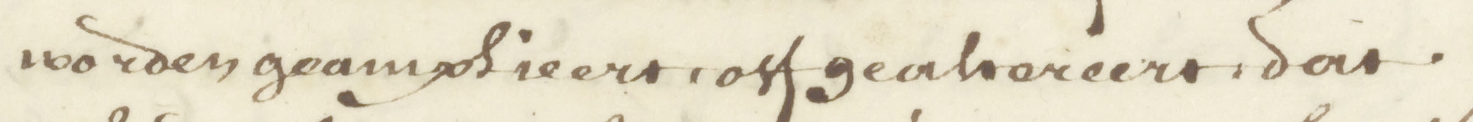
worden geamplieert, off gealtereert, dat
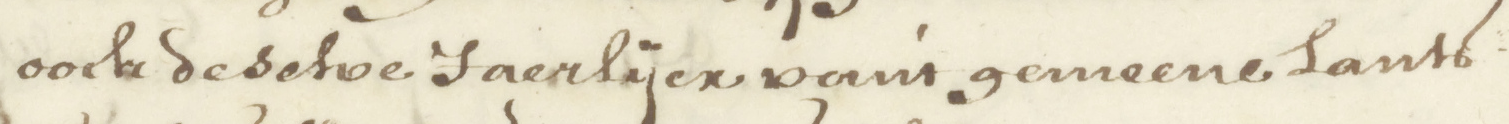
oock deselve Jaerlijcx van‛t gemeene Lants
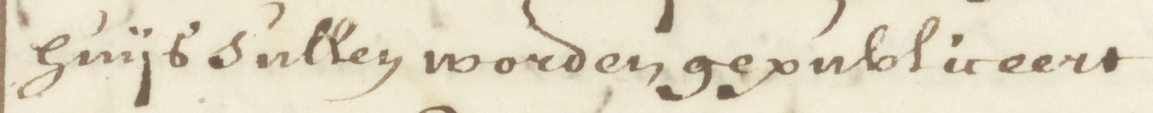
huijs sullen worden gepubliceert
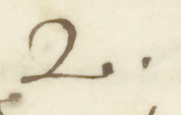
2.
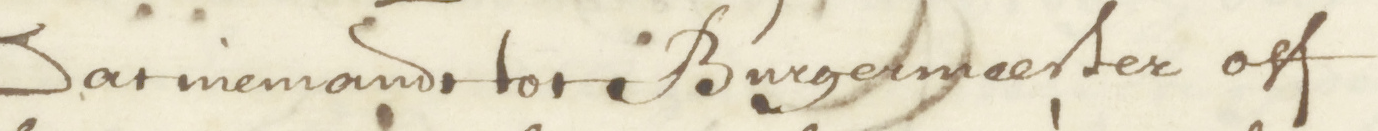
Dat niemandt tot Burgermeester off
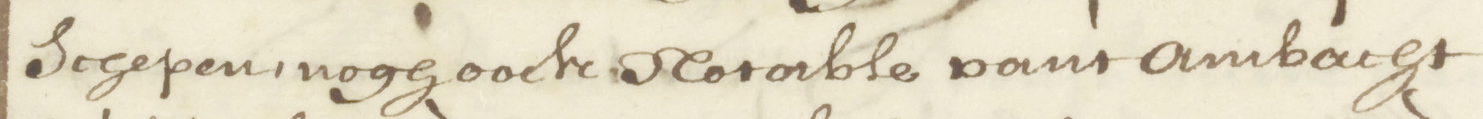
Schepen, nogh oock Notable van‛t Ambacht
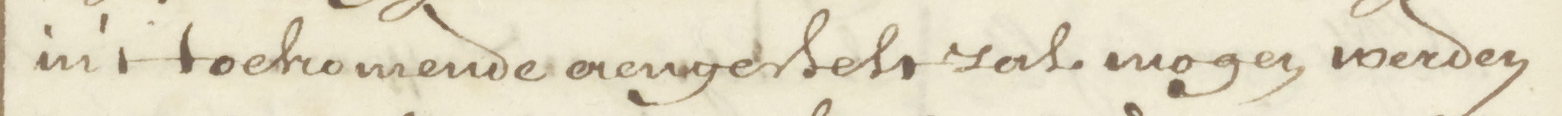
in‛t toekomende aengestelt zal mogen werden
